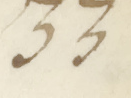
33
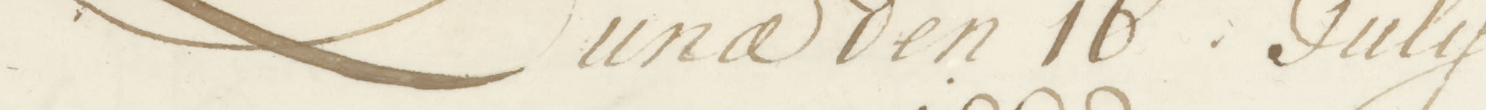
Luna den 16en. Julij
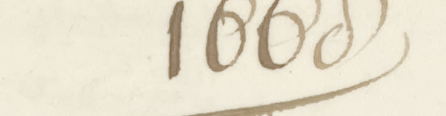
1668
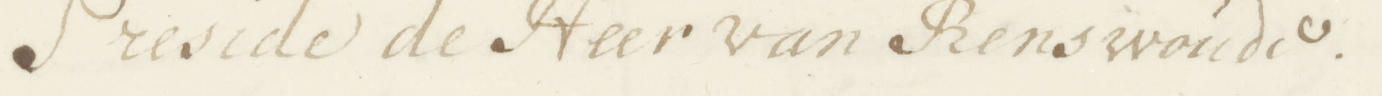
Preside de Heer van Renswoude.
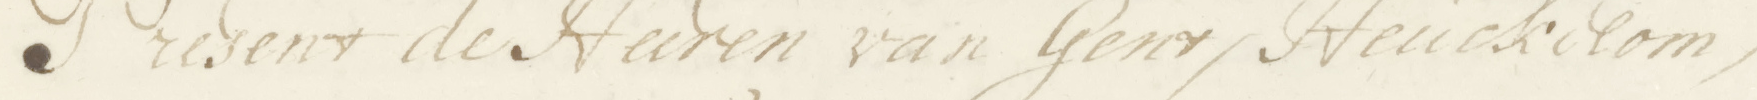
Present de Heeren van Gent, Heuckelom,
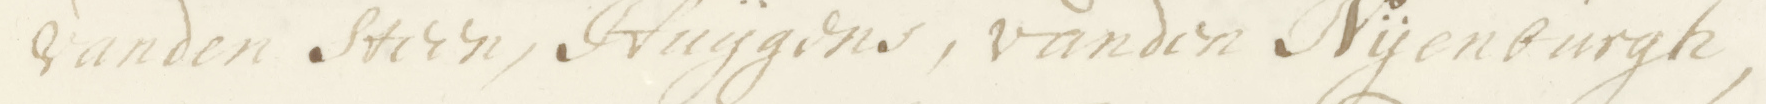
vanden Steen, Huijgens, vanden Nijenburgh,
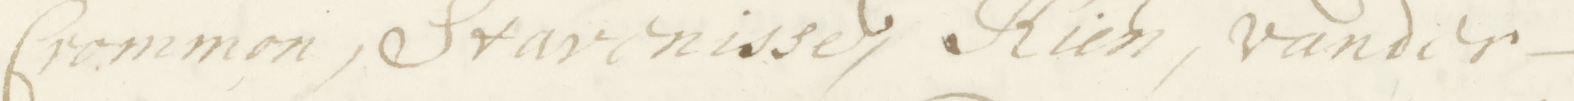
Crommon, Stavenissen, Kien, vander —
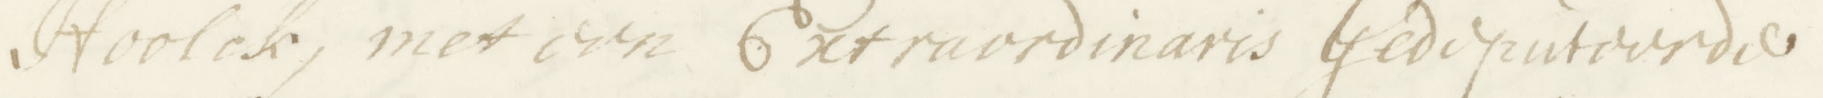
Hoolck met een Extraordinaris Gedeputeerde
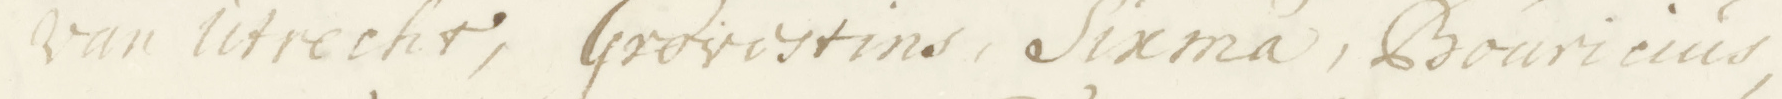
van Utrecht, Grovestins, Sixma, Bouricius,
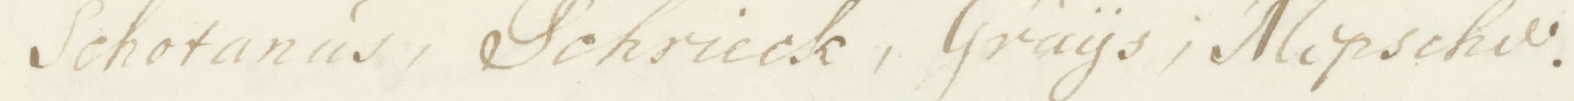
Schotanus, Schrieck, Gruijs, Mepsche.
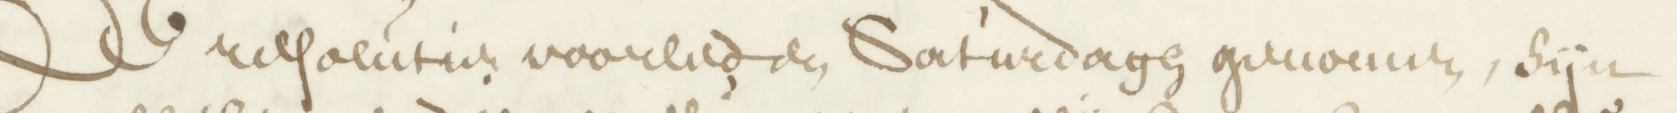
De resolutien voorleden Saturdagh genomen, sijn
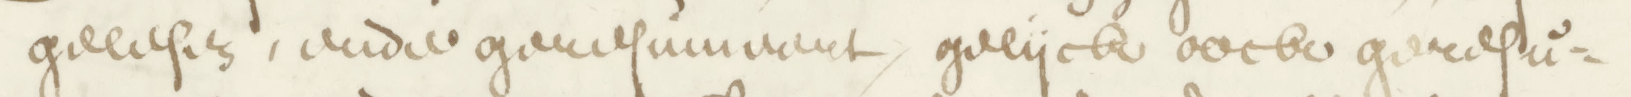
gelesen, ende geresumeert, gelijck oock geresu=
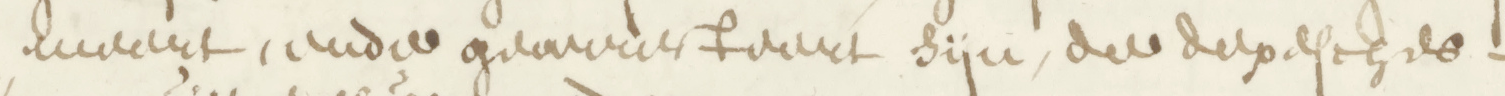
„meert, ende gearresteert sijn, de depesches —
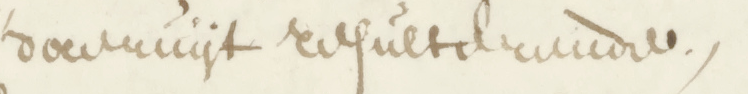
daeruijt resulterende.
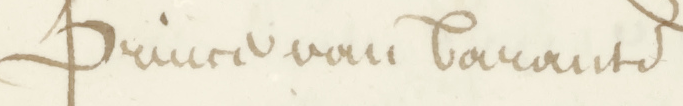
Prince van Tarante
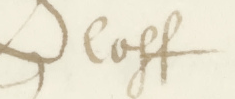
Vloff
